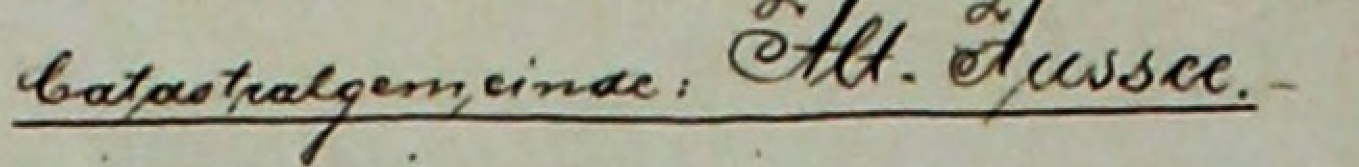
Castastralgemeinde: Alt-Aussee.
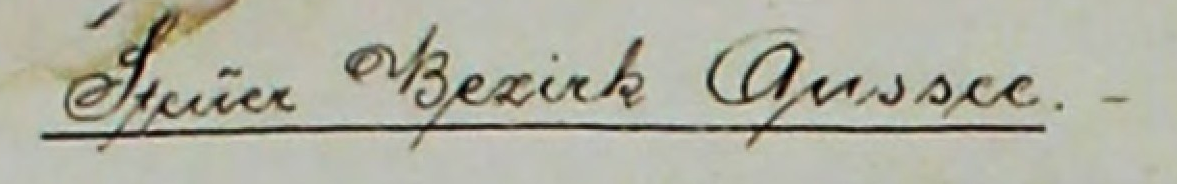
Steuer Bezirk Aussee.-
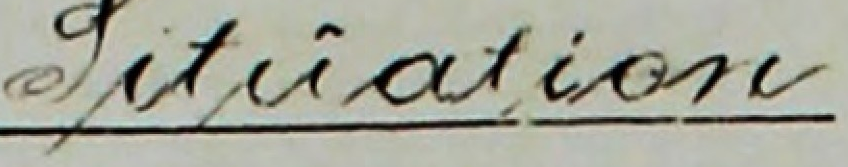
Situation
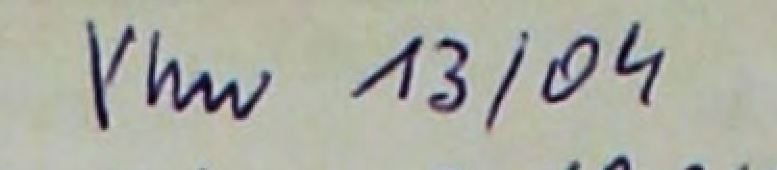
Vhw 13/04
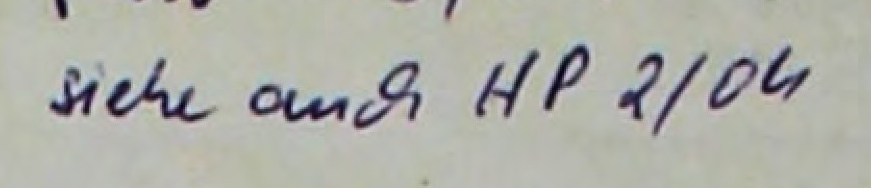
siehe auch HP 2/04
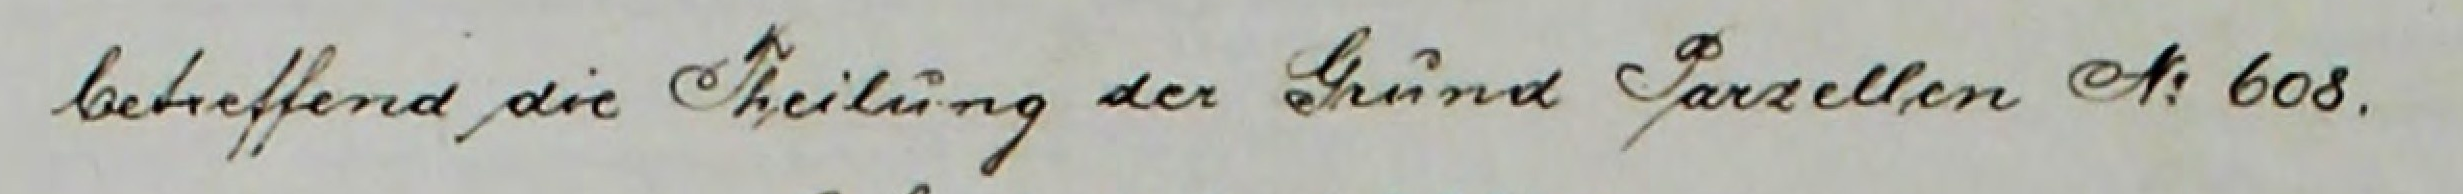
betreffend die Theilung der Grund Parzellen N: 608.
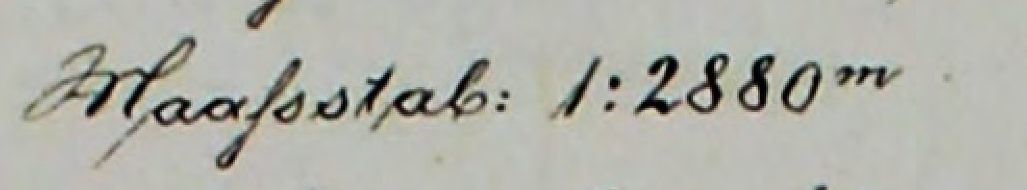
Maasstab: 1:2880 m
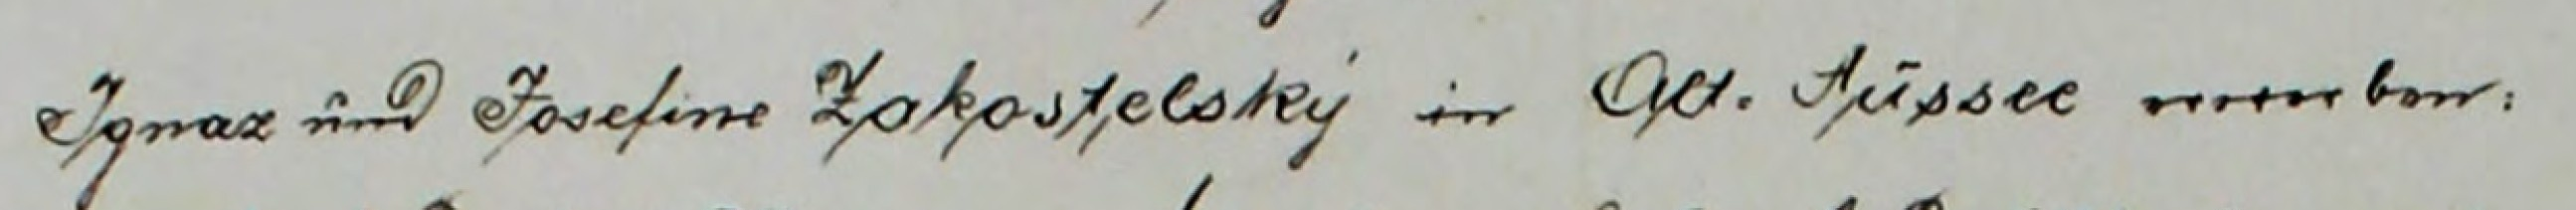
Ignaz und Josefine Zokostelský in Alt=Aussee vererben:
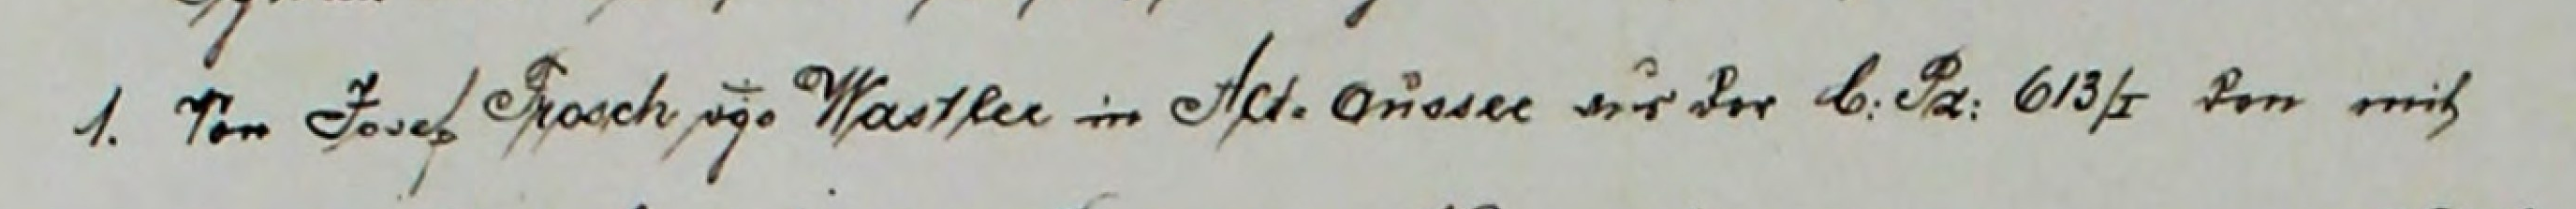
1. Von Josef Trosch ??? Wastler in Act=Aussee aus der C: Px: 613/I den mit
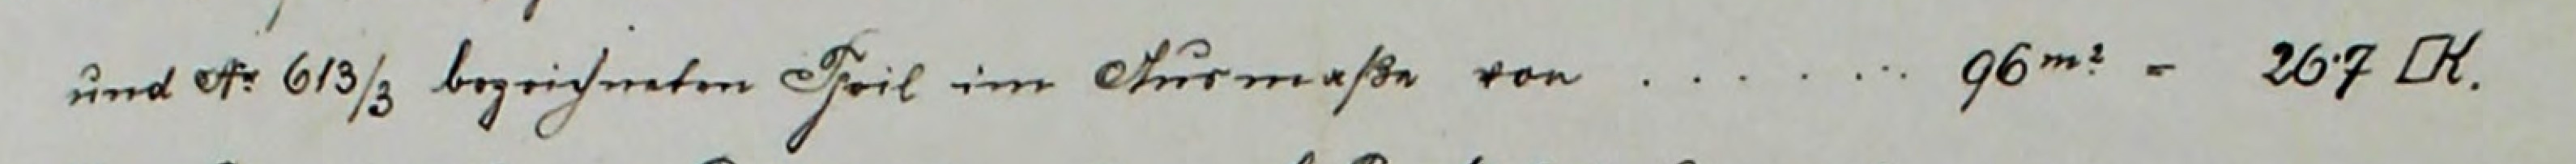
und Nr. 613/3 begrichrieden April im Ausmaße von ..... 96 m2 = 26.7 K.
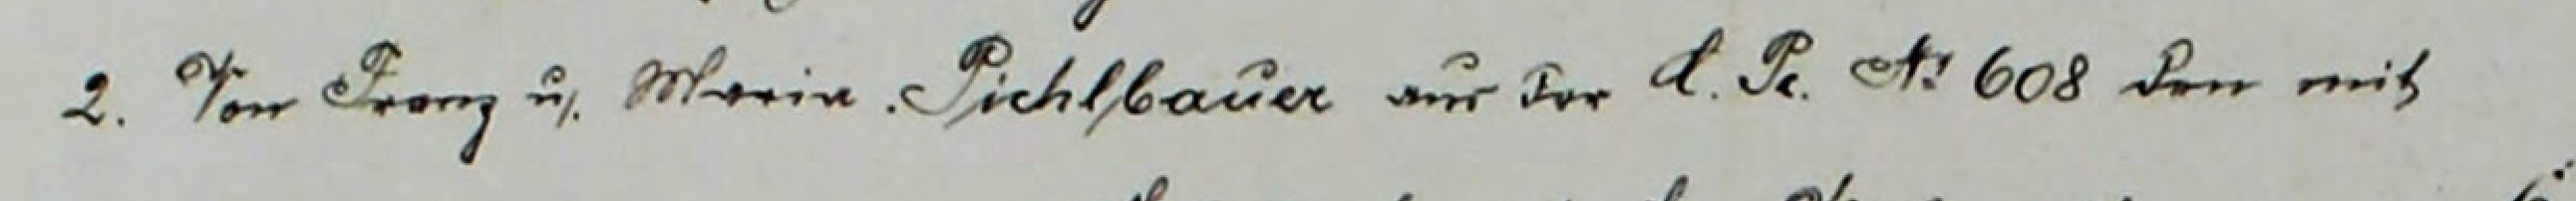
2. Von Franz u. Maria Pichlbauer aus der C. Pz. Nr 608 den mit
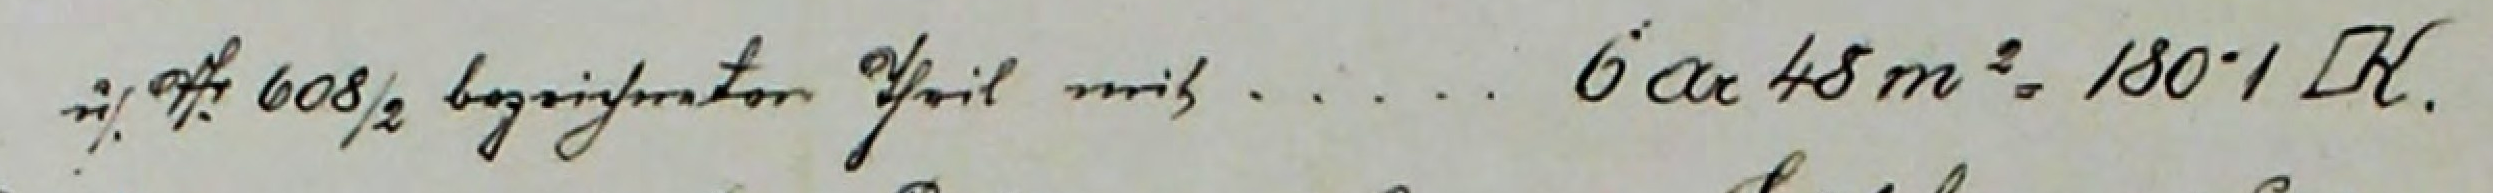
u. Nr. 608/2 bezeichneten Theil mit ..... 6 ar 48 m2 = 180.1 K.
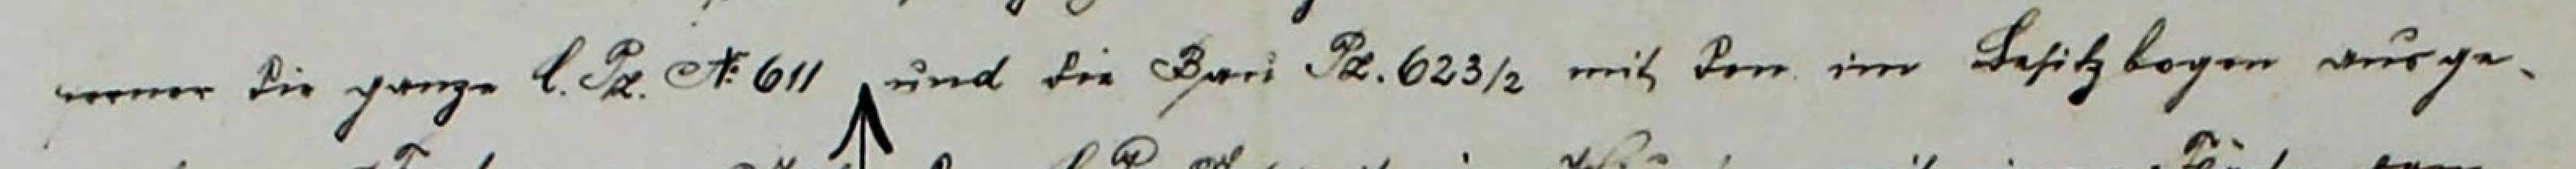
seiner die ganze C. Pz. Nr. 611und die Bau Pz. 623/2 mit den Besitzbogen ausge„
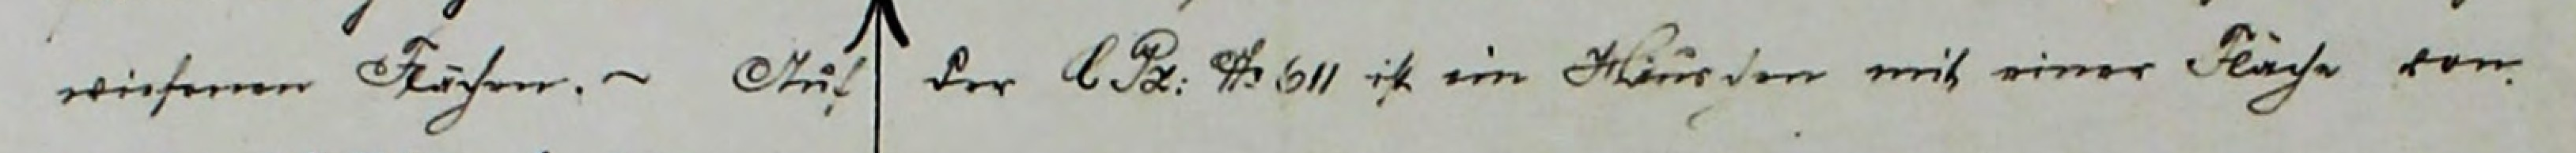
wiesenen Flächen. ~ Auf der C Pz: Nr. 611 ist im Hiuschen mit einer Fläche von.
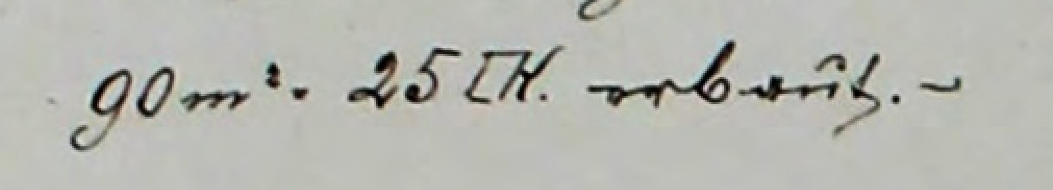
90 m2 = 25 CK. erbaut. ~
